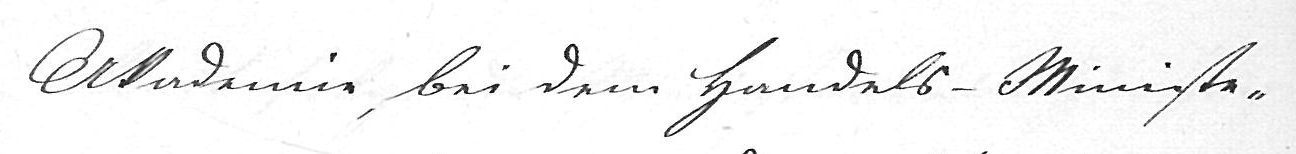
Akademie, bei dem Handels-Ministe-
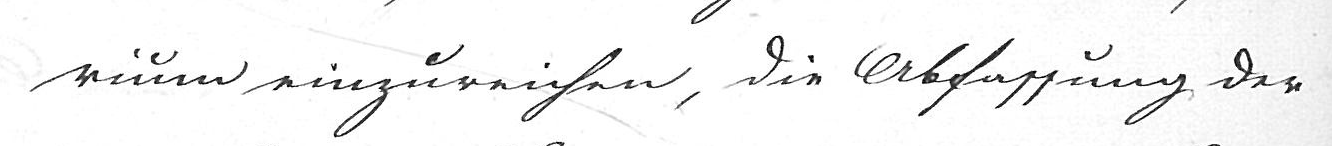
rium einzureichen, die Abfassung der
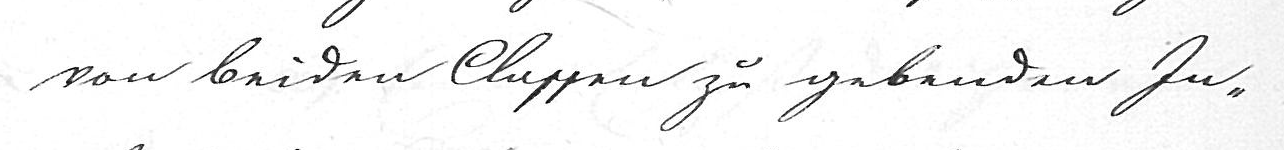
von beiden Classen zu gebenden In-
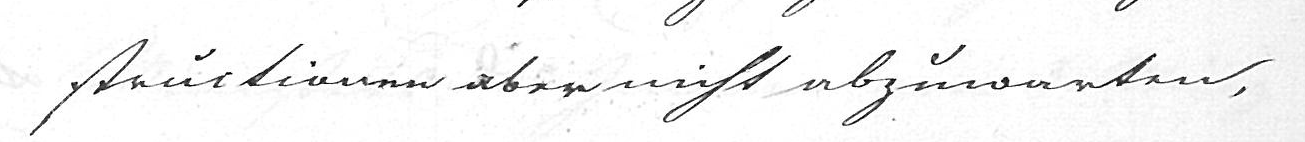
structionen aber nicht abzuwarten,
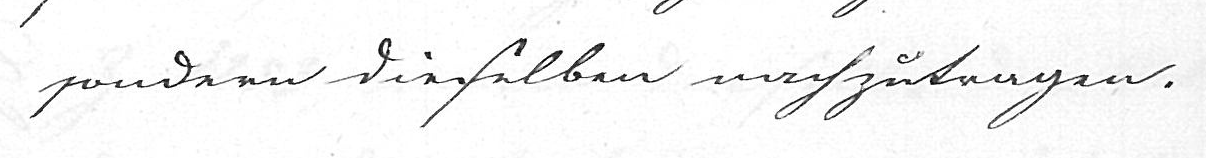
sondern dieselben nachzutragen.
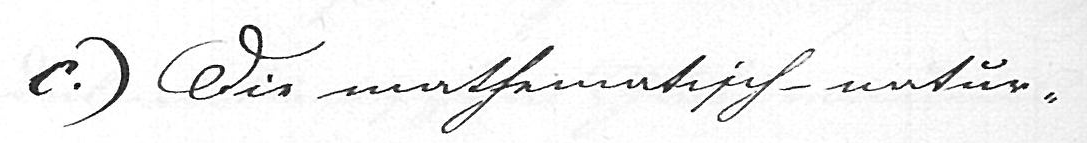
c) Die mathematisch-natur-
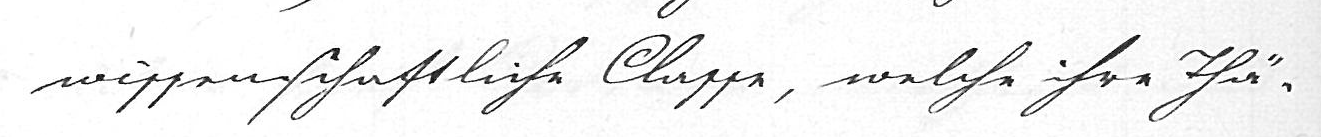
wissenschaftliche Classe, welche ihre Thä-
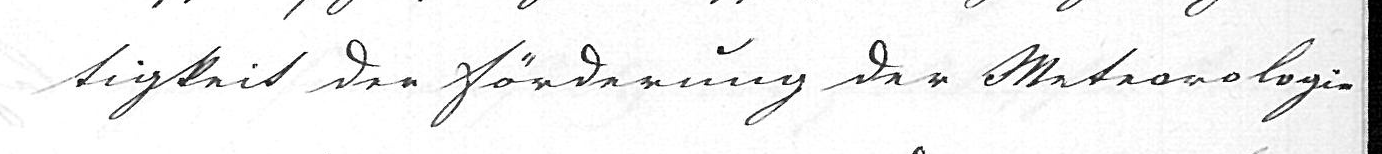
tigkeit der Förderung der Meteorologie
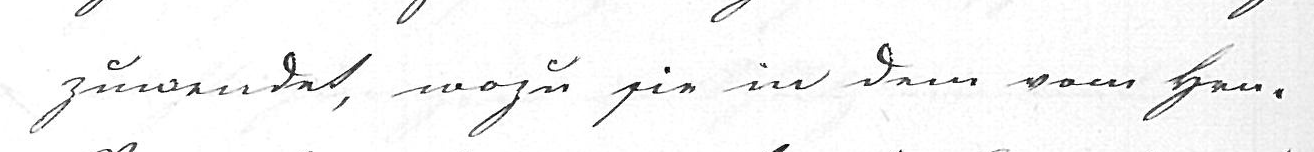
zuwendet, wozu sie in dem vom Hrn.
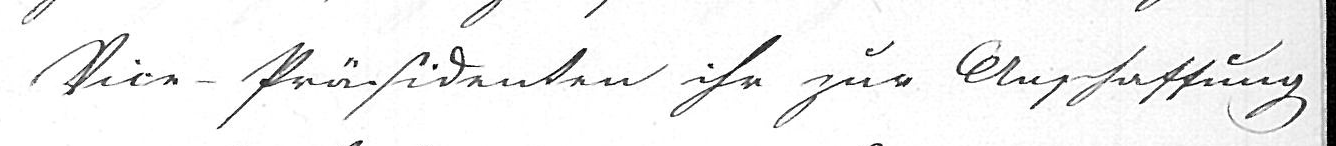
Vice-Präsidenten ihr zur Anschaffung
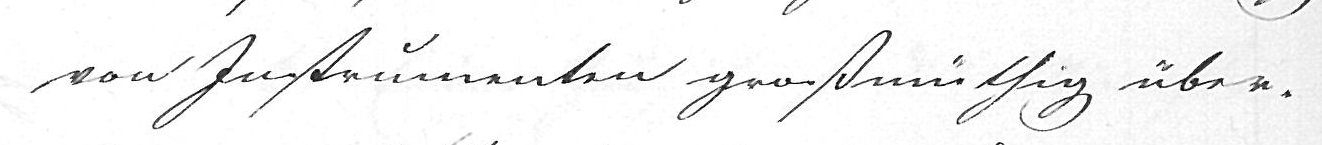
von Instrumenten großmüthig über-
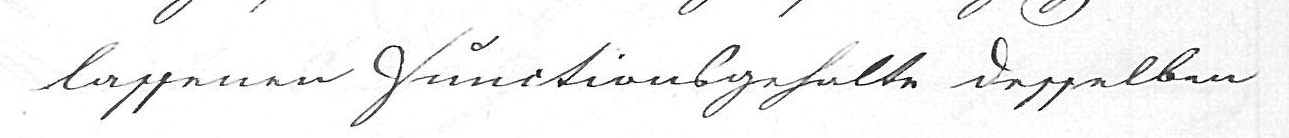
lassenen Functionsgehalte desselben
